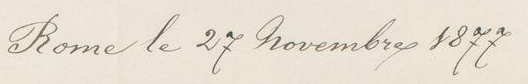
Rome le 27 Novembre 1877
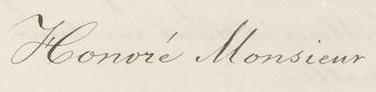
Honoré Monsieur
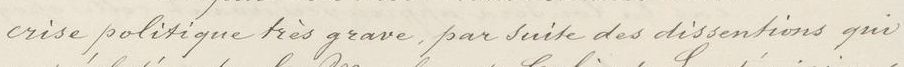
crise politique très grave, par suite des dissentions qui
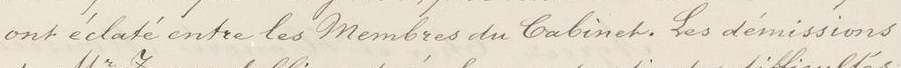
ont éclaté entre les Membres du Cabinet. Les démissions
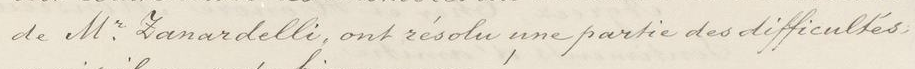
de MrZanardelli, ont résolu une partie des difficultés,
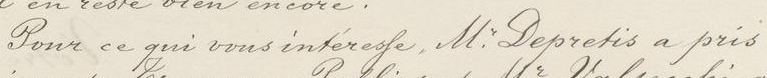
Pour ce qui vous intéresse, MrDepretis a pris
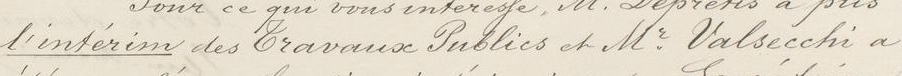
l'intérim des Travaux Publics et MrValsecchi a
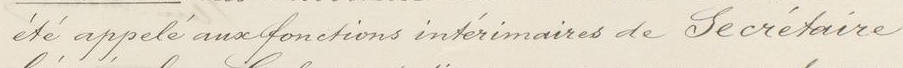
été appelé aux fonctions intérimaires de Secrétaire
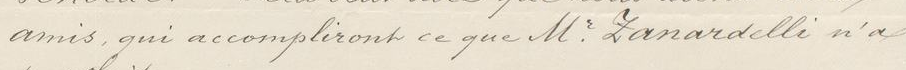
amis, qui accompliront ce que MrZanardelli n'a
